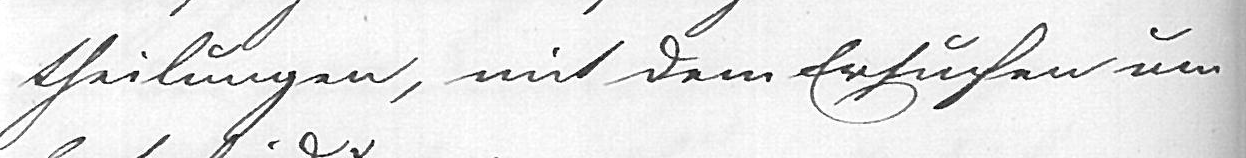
theilungen, mit dem Ersuchen um
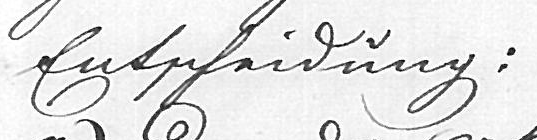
Entscheidung:
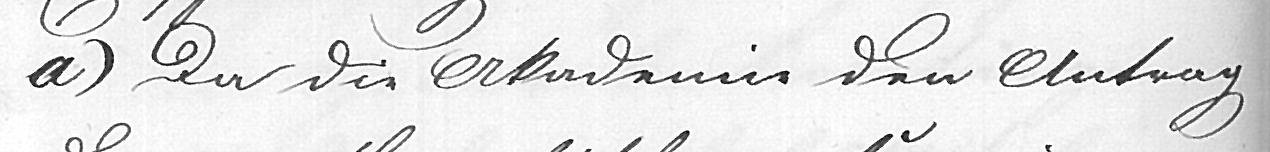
a) Das die Akademie den Antrag
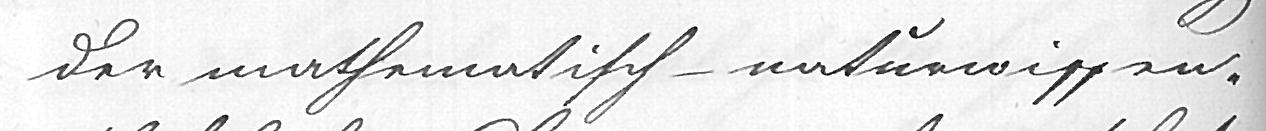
der mathematisch-naturwissen-
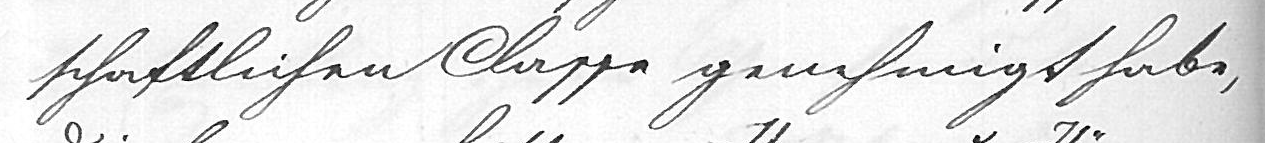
schaftlichen Classe genehmigt habe,
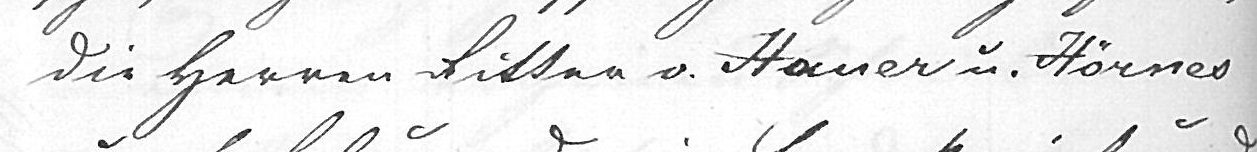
die Herren Ritter v. Hauer u. Hörnes
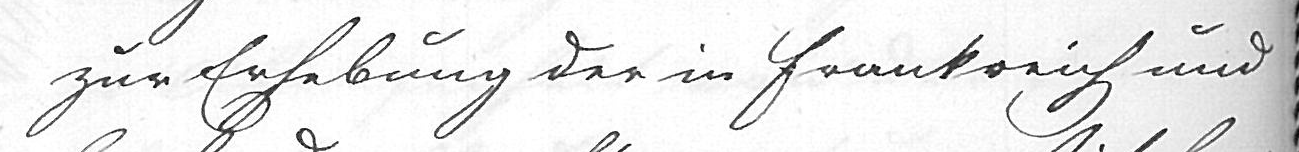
zur Erhebung der in Frankreich und
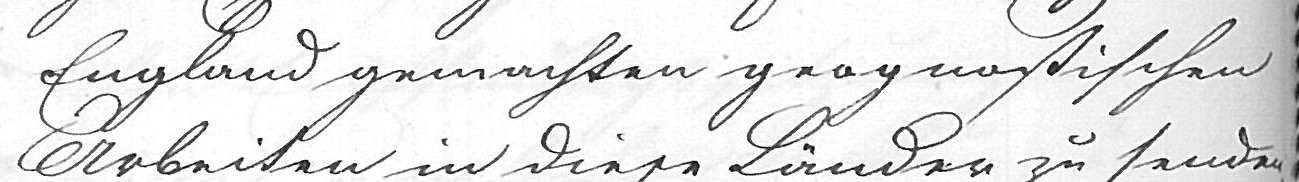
England gemachten geognostischen
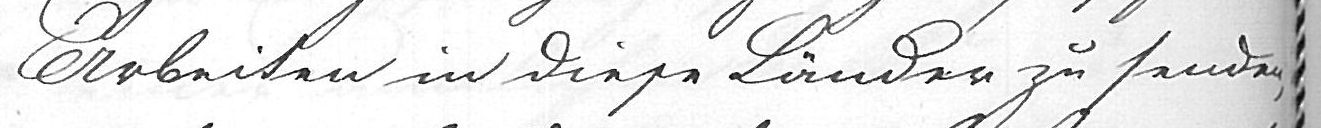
Arbeiten in diese Länder zu senden,
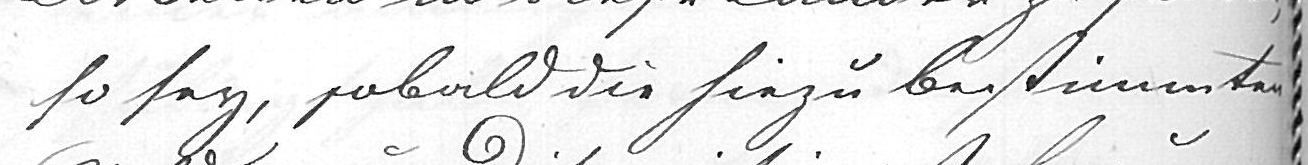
so sey, sobald die hiezu bestimmten
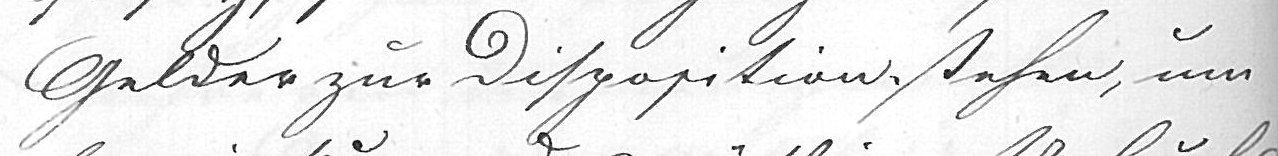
Gelder zur Disposition stehen, um
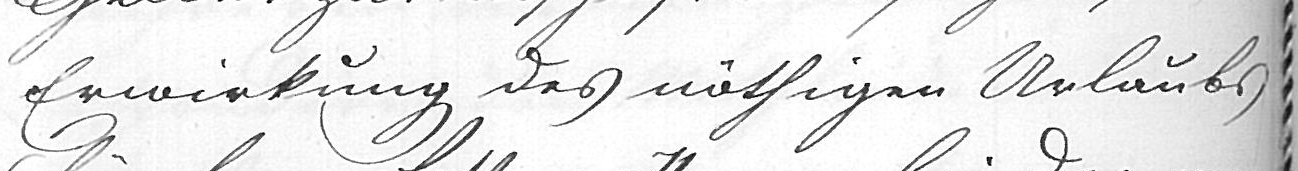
Erwirkung des nöthigen Urlaubs
